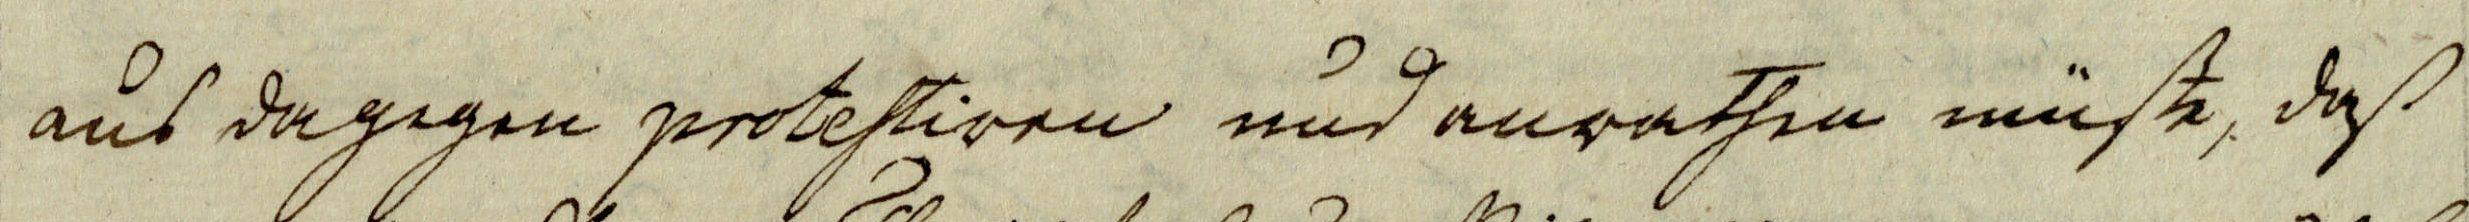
aus dagegen protestiren und anrathen müßte, daß
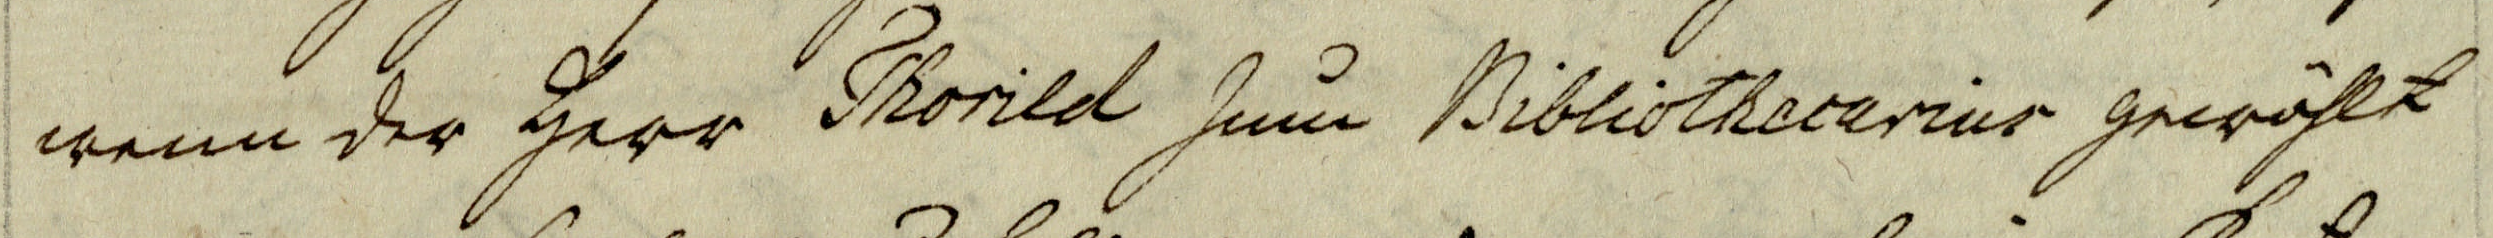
wenn der Herr Thorild zum Bibliothecarius gewählt
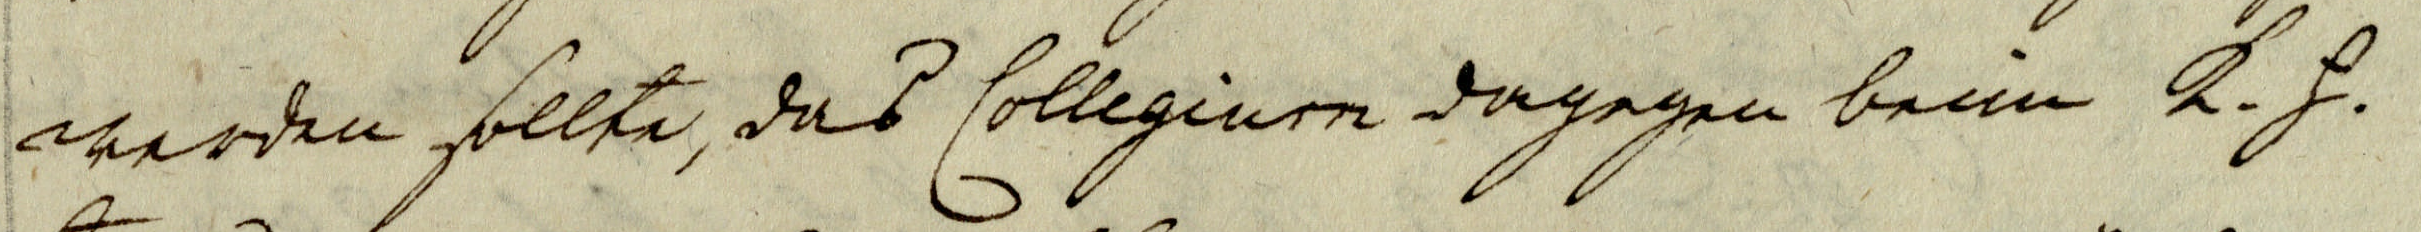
werden sollte, das Collegium dagegen beim K. H.
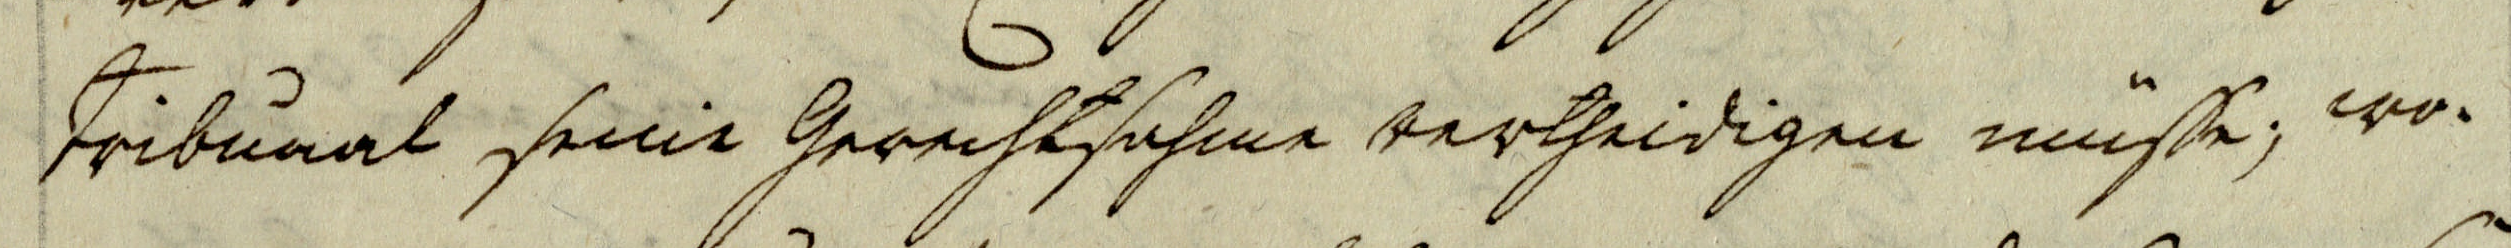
Tribunal seine Gerechtsahme vertheidigen müsse; wo¬
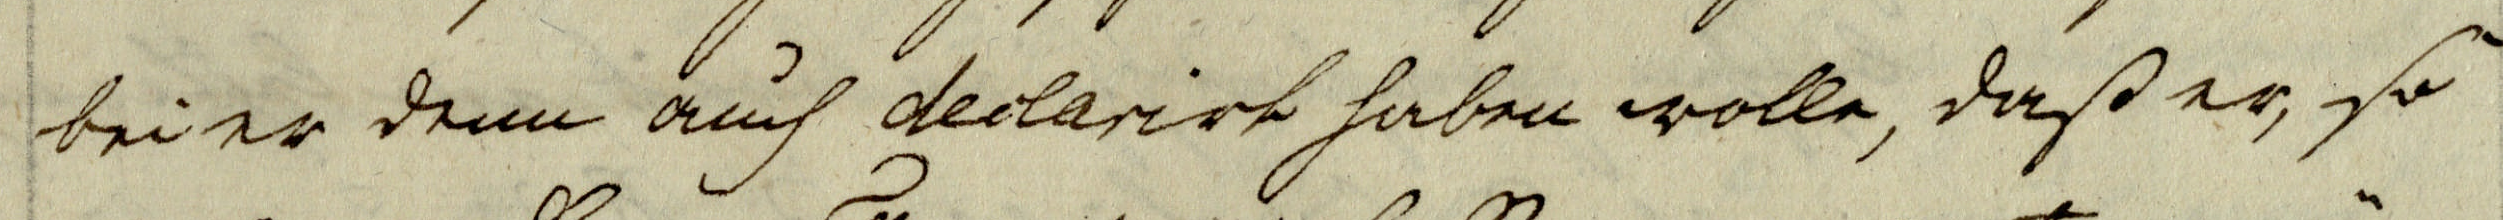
bei er denn auch declarirt haben wolle, daß er, so¬
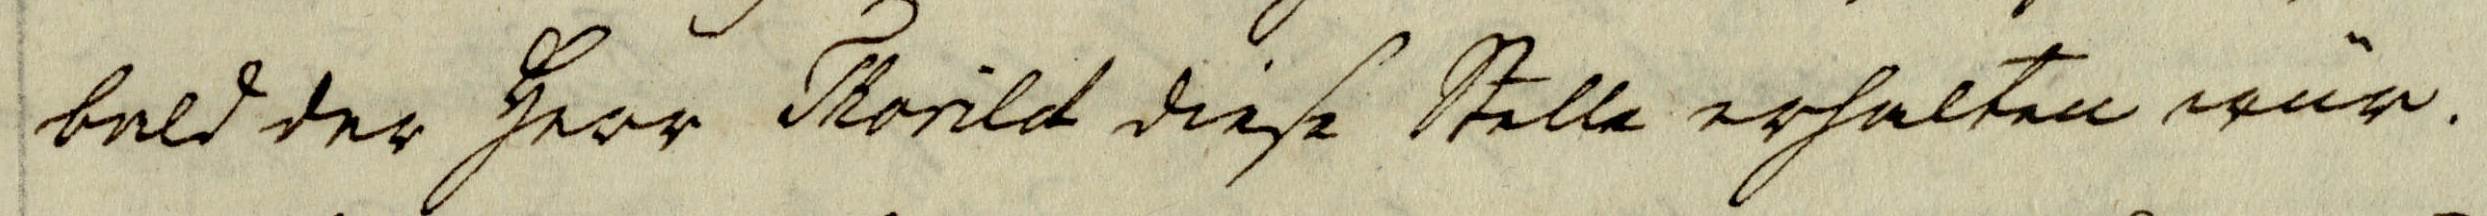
bald der herr Thorild diese Stelle erhalten wür¬
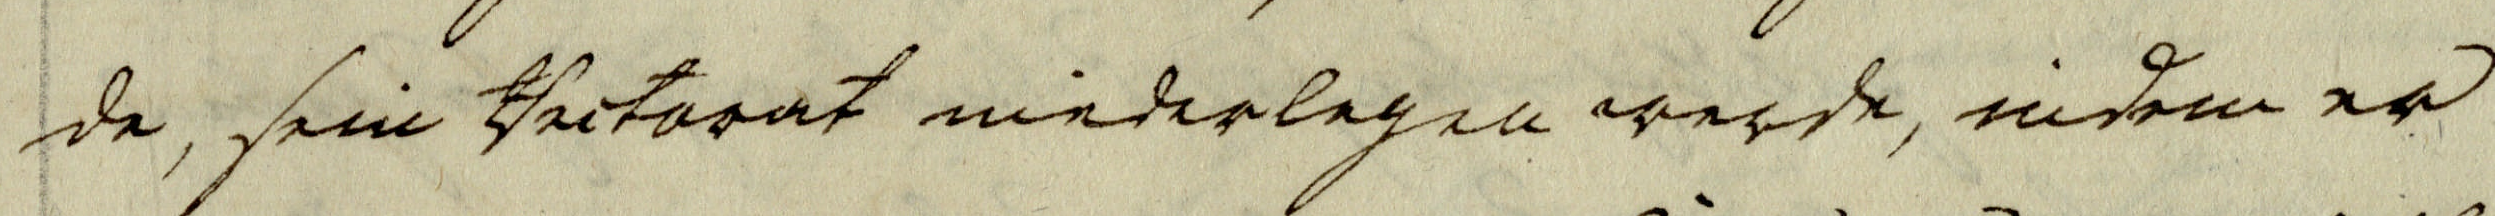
de, sein Rectorat niederlegen werde, indem er
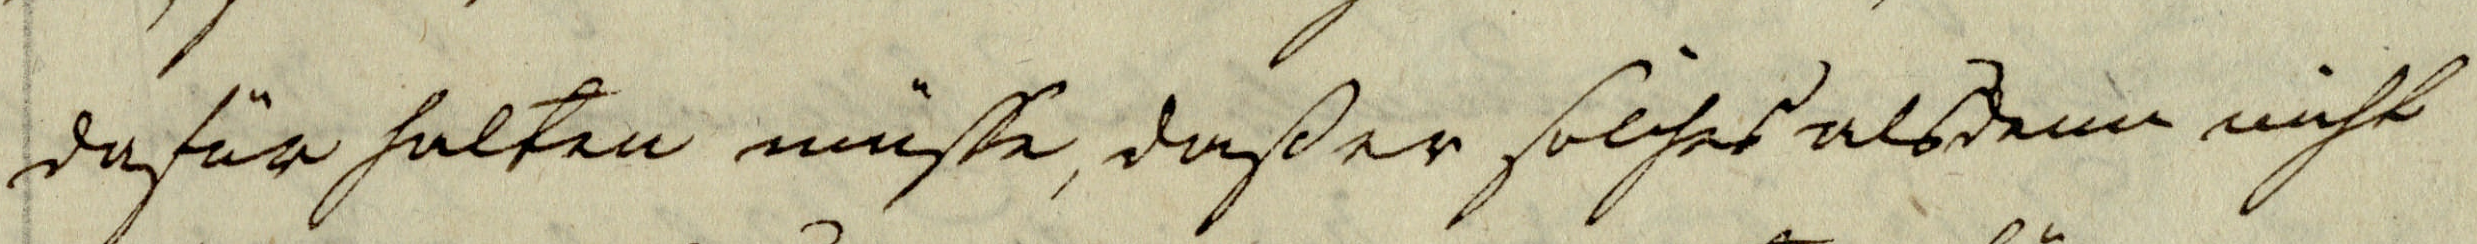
dafür halten müsse, daß er solches alsdann nicht
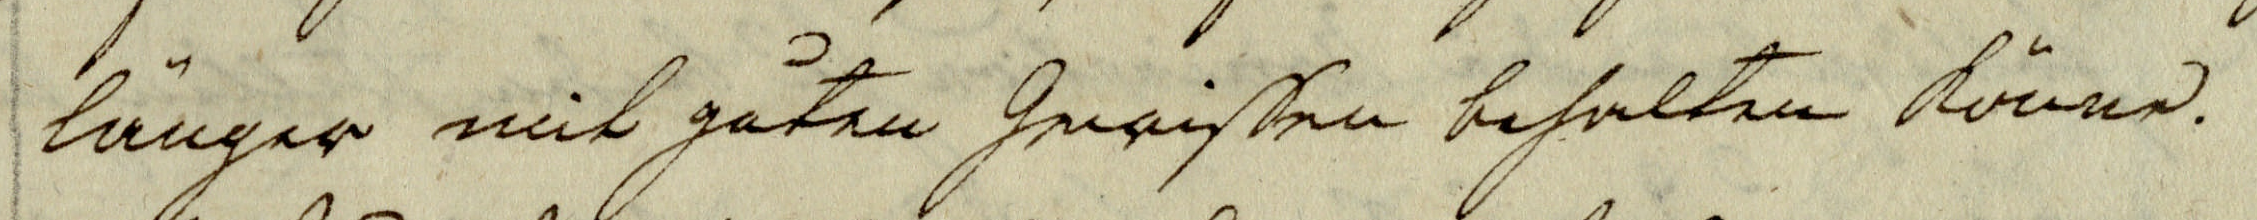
länger mit guten Gewissen behalten könne.
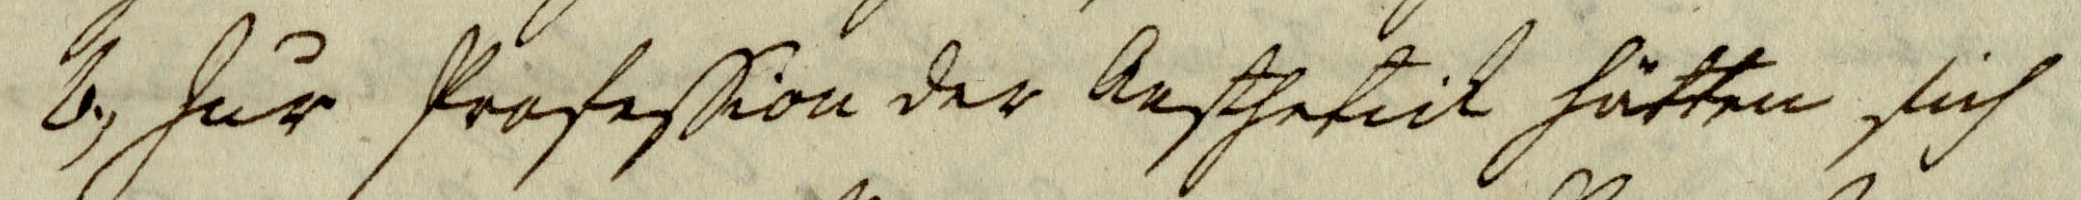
b., Zur Profession der Aesthetick hätten sich
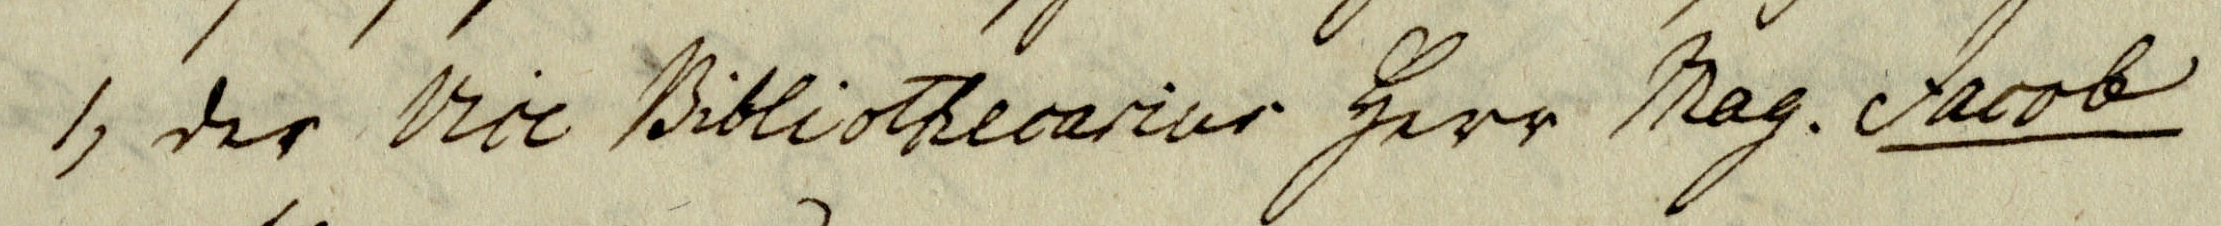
1., der Vice Bibliothecarius Herr Mag. Jacob
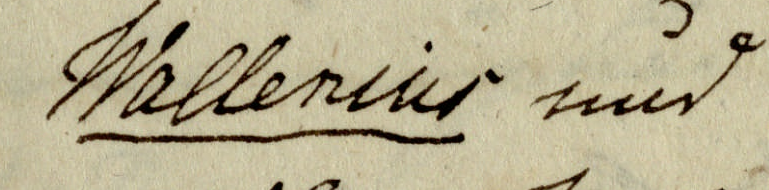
Wallenius und
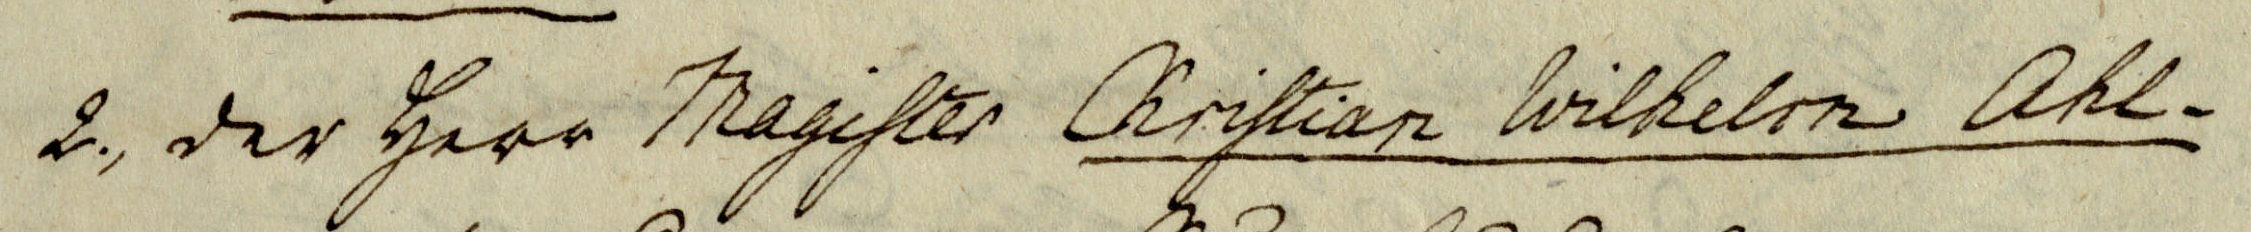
2., der Herr Magister Christian Wilhelm Ahl¬
